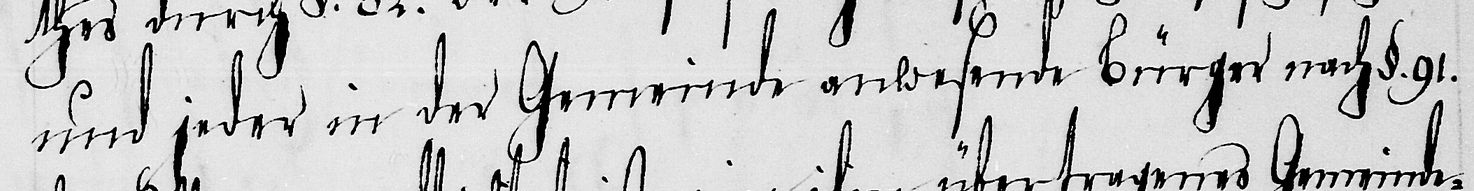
und jeder in der Gemeinde anwesende Bürger nach §.
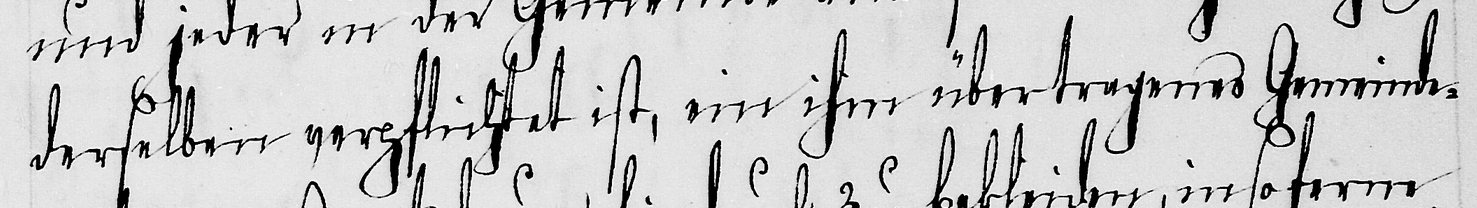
derselben verpflichtet ist, ein ihm übertragenes Gemeind¬
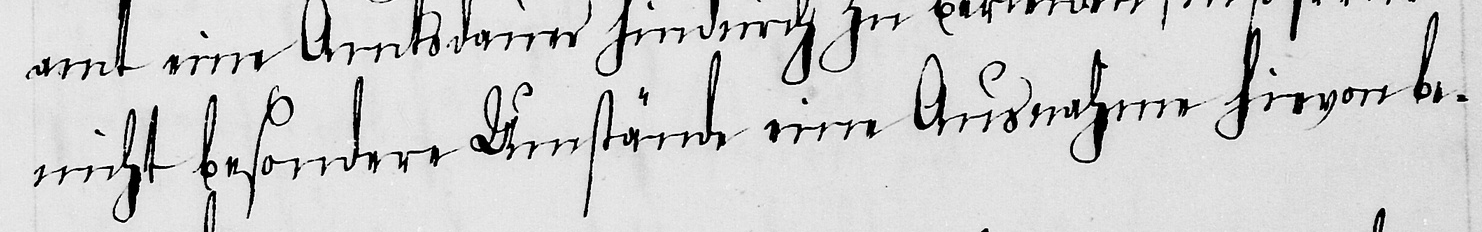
nicht besondere Umstände eine Ausnahme hievon be¬
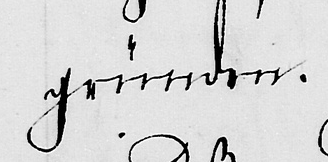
gründen.
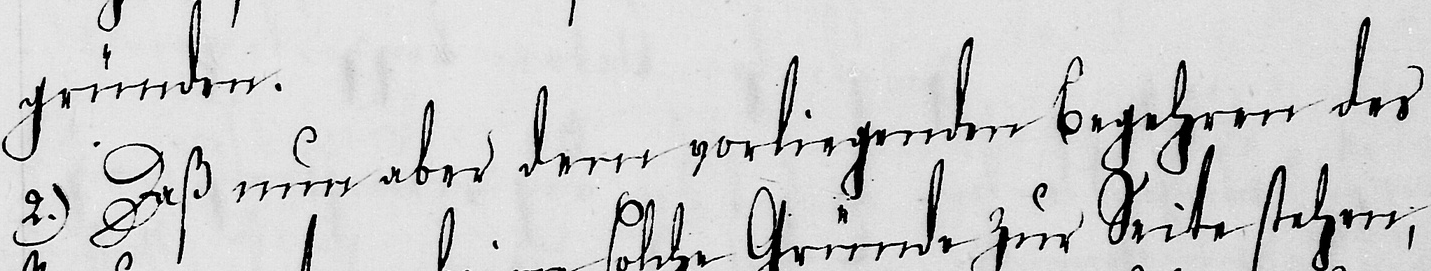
2.) Daß nun aber dem vorliegenden Begehren des
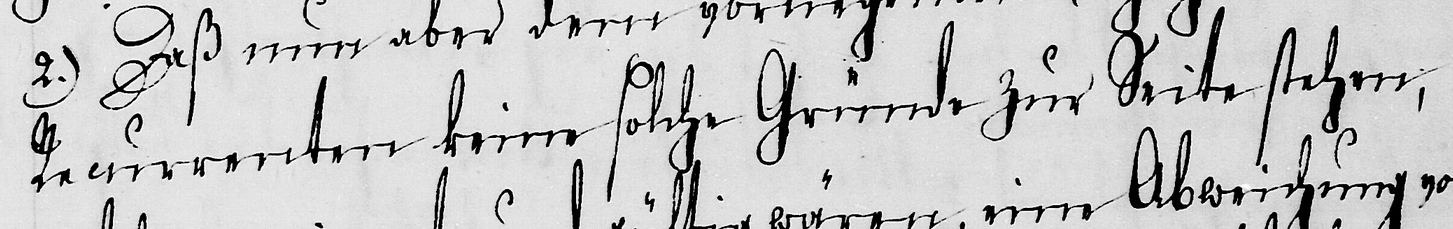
Recurrenten keine solche Gründe zur Seite stehen,
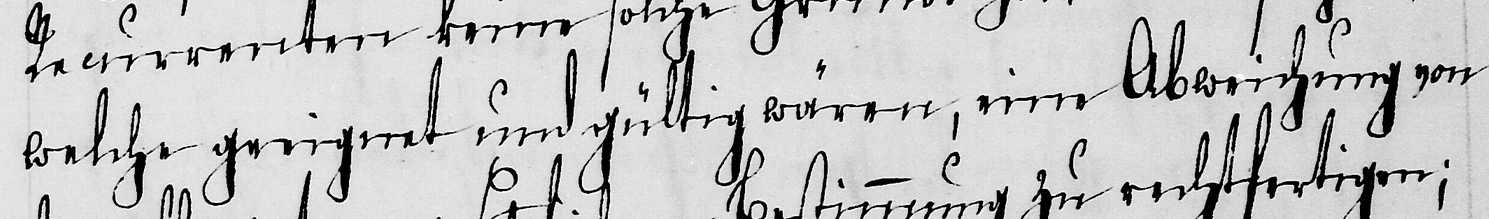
welche geeignet und gültig wären, eine Abweichung von
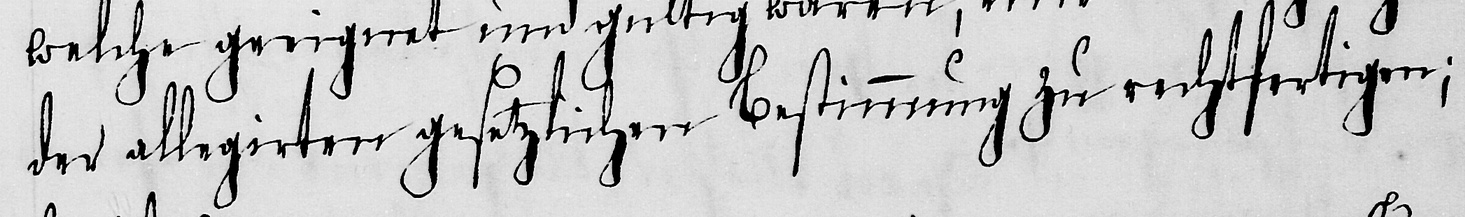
der allegirten gesetzlichen Bestimmung zu rechtfertigen;
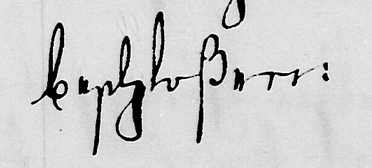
beschloßen:
